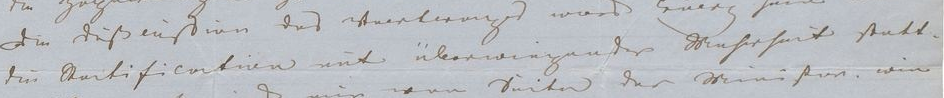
die Ratification mit überwiegender Mehrheit statt-
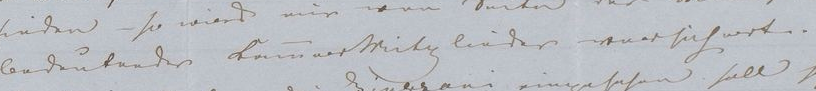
bedeutender Kammer Mitglieder versichert.
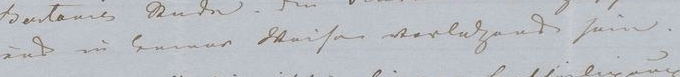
und in keiner Weise verletzend sein. –
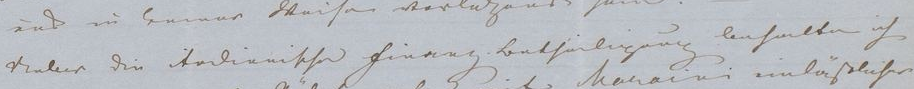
Ueber die italienische Finanz-Betheiligung behalte ich
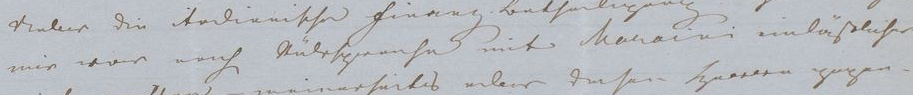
mir vor nach Rüksprache mit Maraini einläßlicher
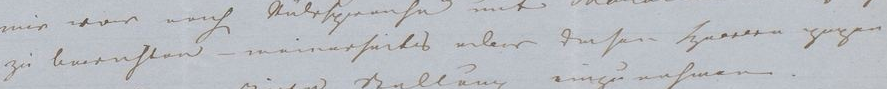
zu berichten – meinerseits aber diesen Herrn gegen-
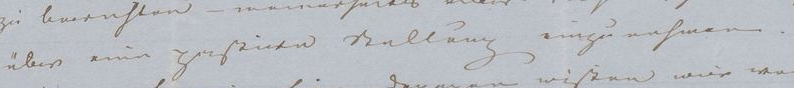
über eine paßive Stellung einzunehmen.
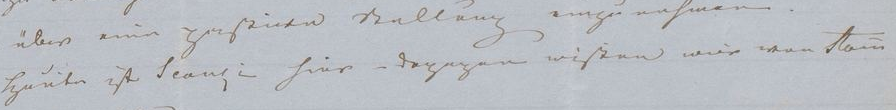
Heute ist Scanzi hier – dagegen wißen wir von Stamm
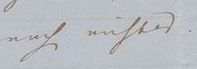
noch nichts. –
